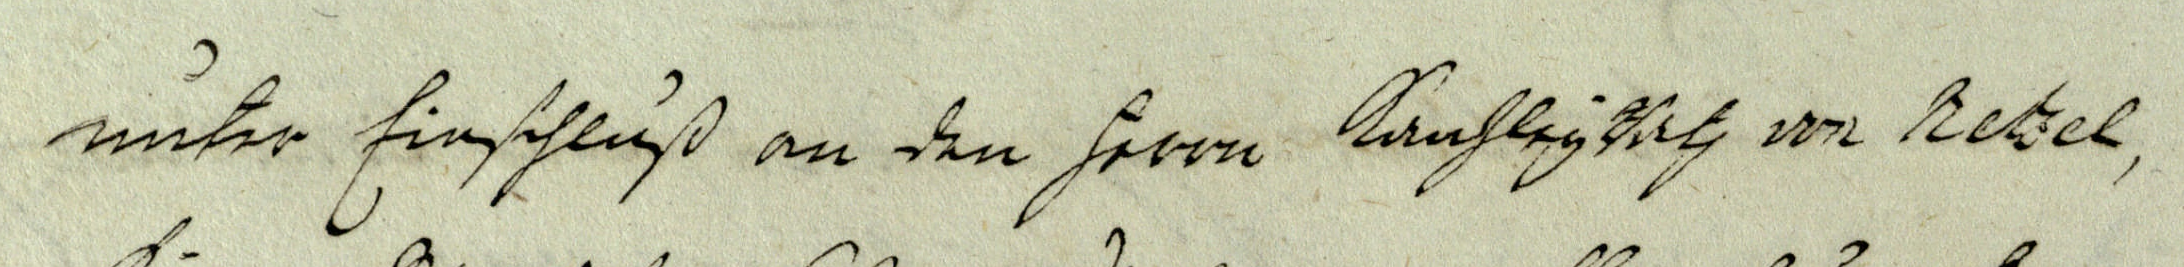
unter Einschluß an den Herrn Kanzleÿ Rath von Netzel,
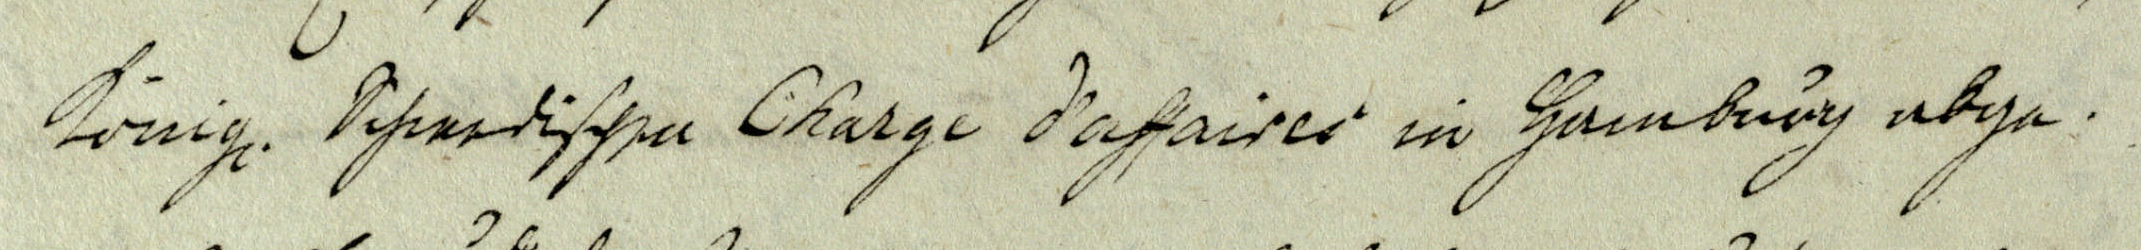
Königl. Schwedischer Charge d´ affaires in Hamburg abge¬
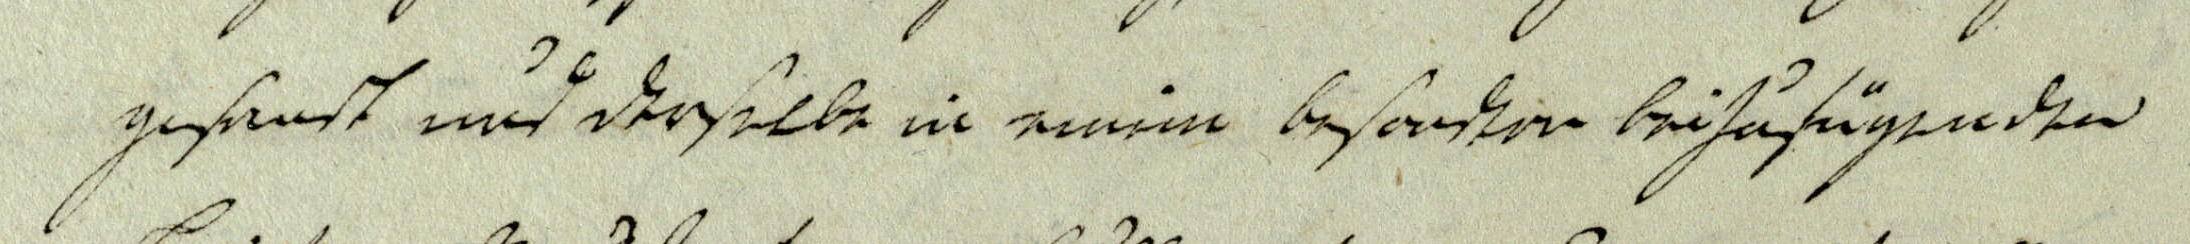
gesandt und derselbe in einem besondern beizufügenden
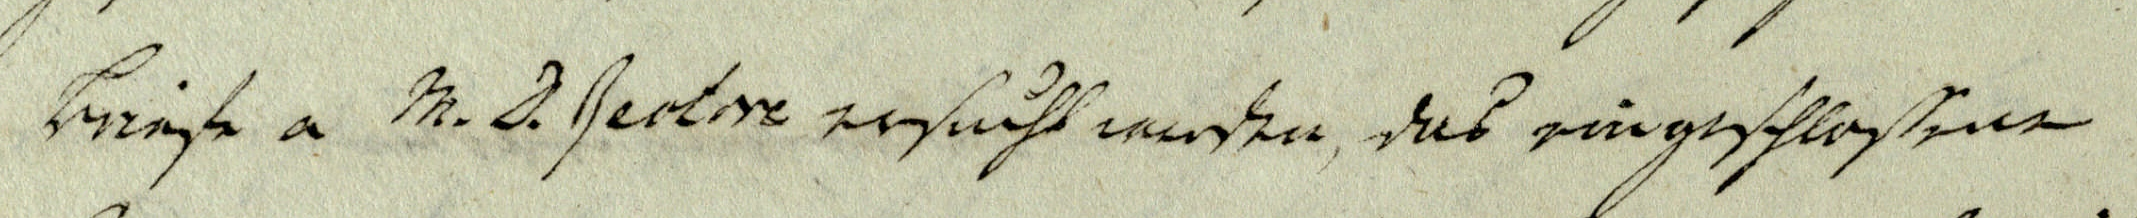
Briefe a M. D. Rectore ersucht werden, das eingeschlossene
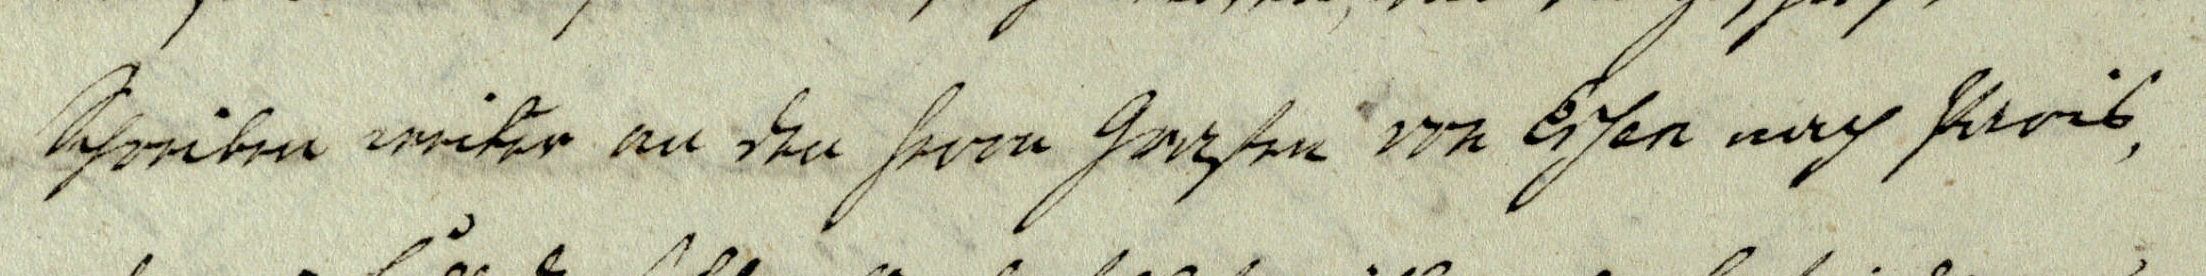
Schreiben weiter an den Herrn Grafen von Essen nach Paris,
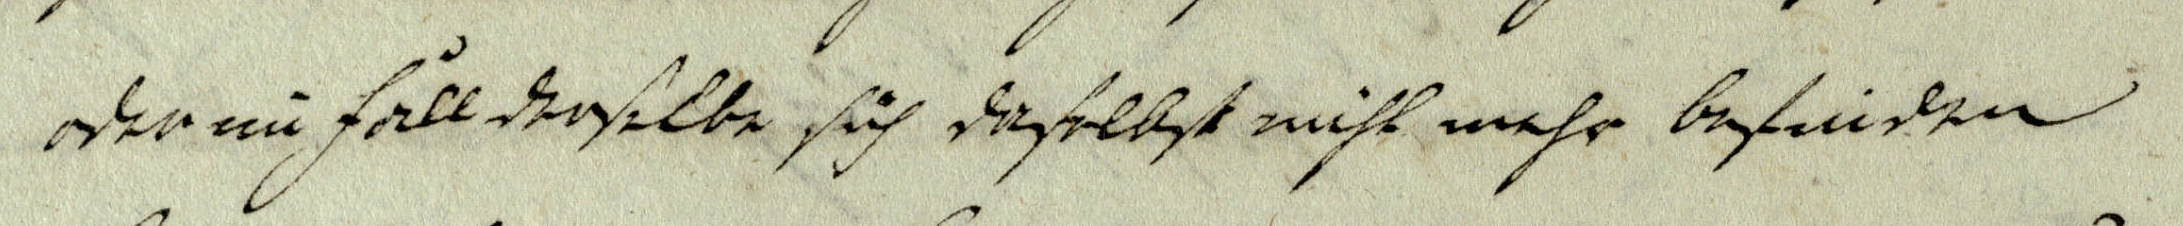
oder im Fall derselbe sich daselbst nicht mehr befinden
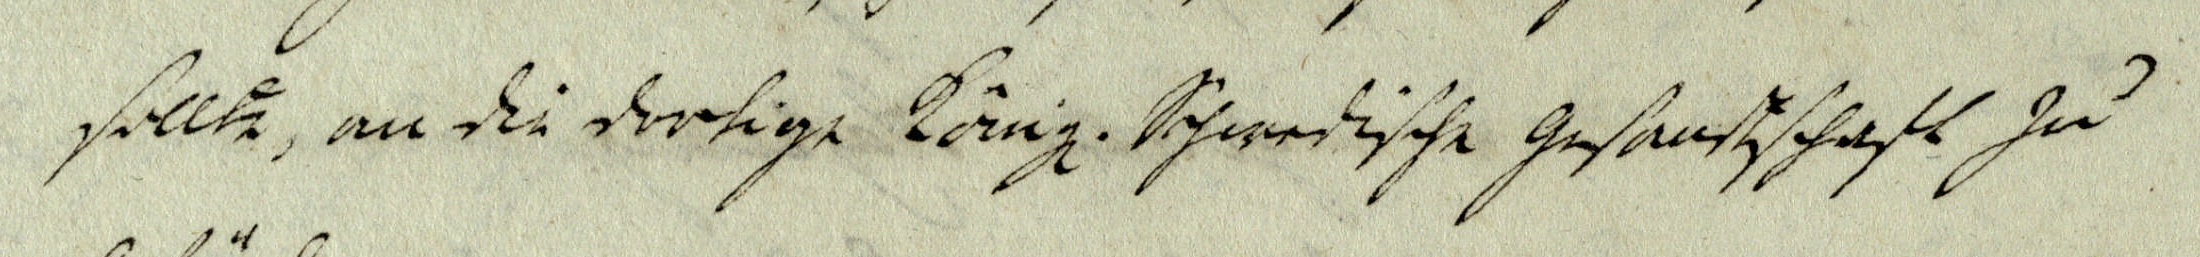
sollte, an die dortige Königl. Schwedische Gesandschaft zu
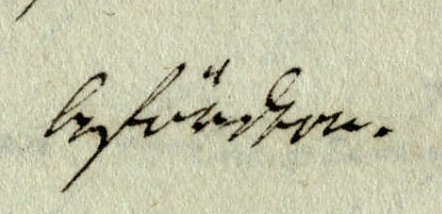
befördern.
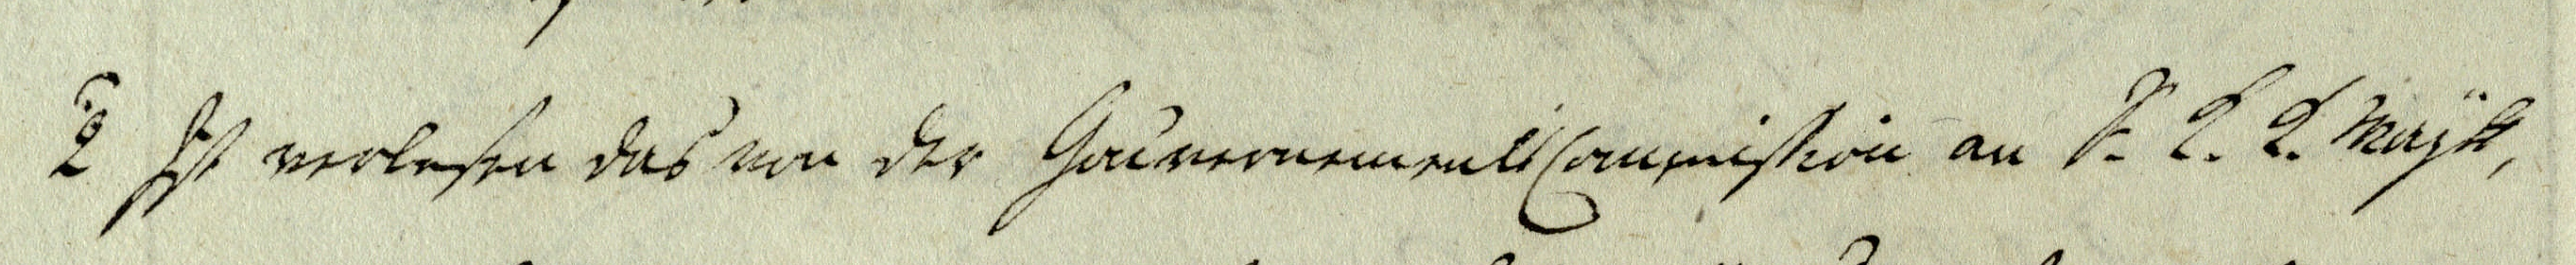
2 Ist verlesen das von der Gouvernements Commission an Sr. K. K. Maÿtt,
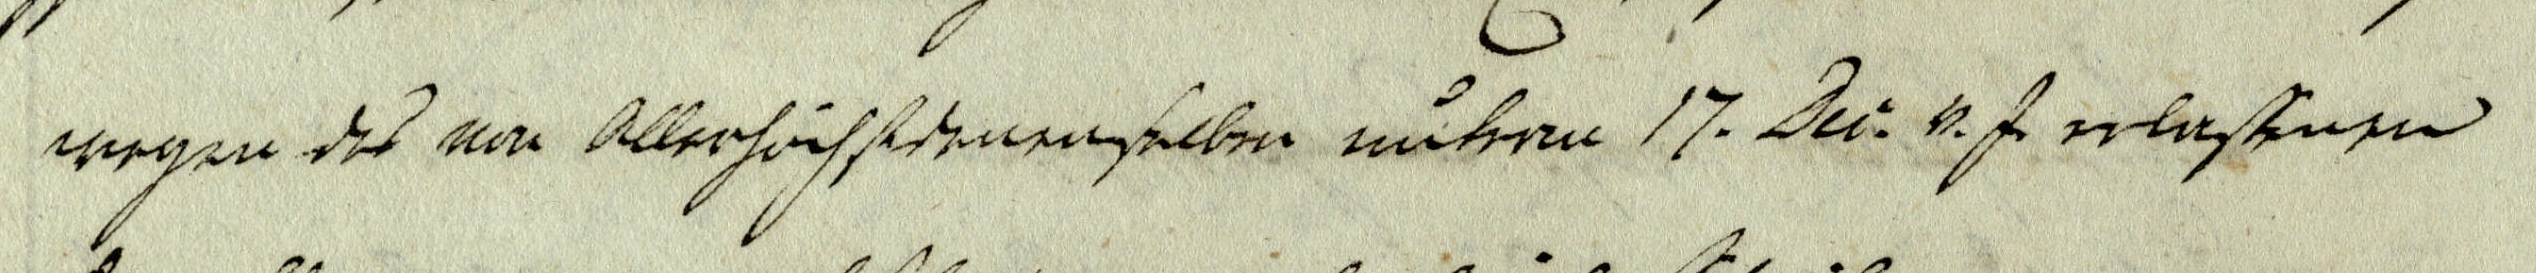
wegen des von Allerhöchstdenenselben unterm 17. Dec. v. J. erlassenen
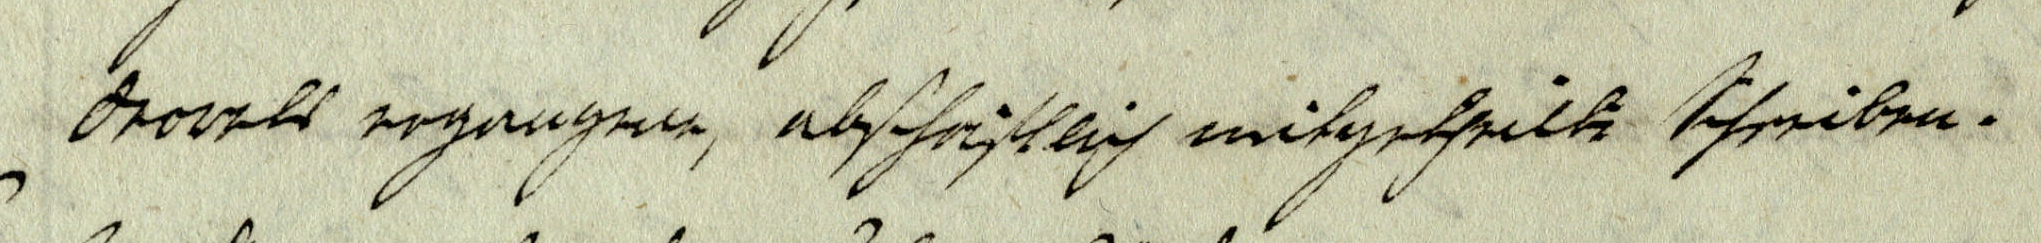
Decrets ergangene, abschriftlich mitgetheilte Schreiben.
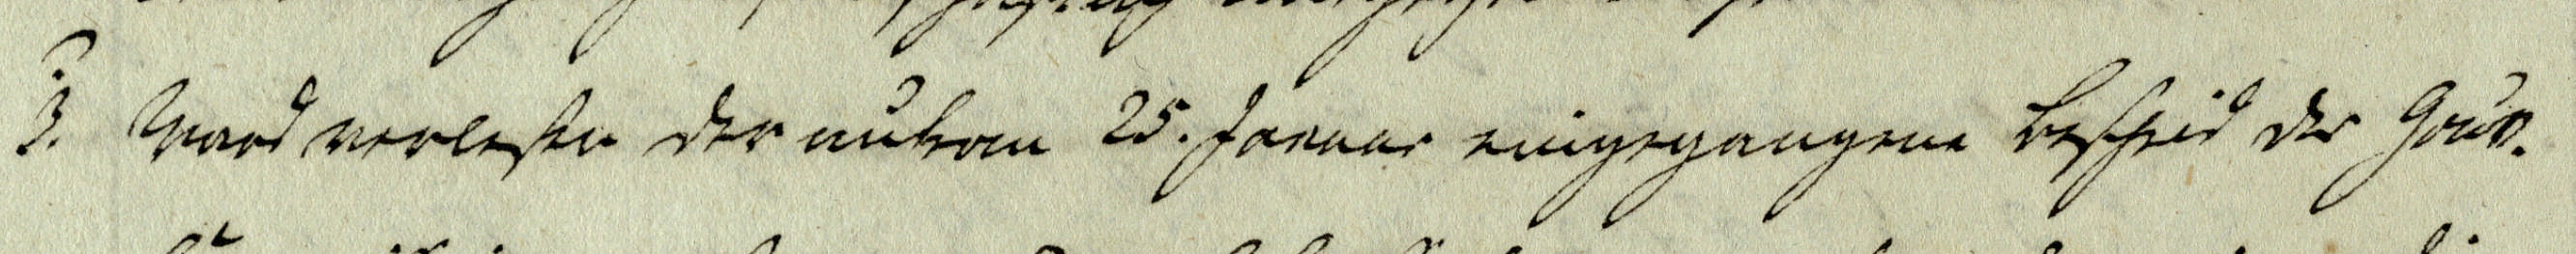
3 Ward verlesen der unterm 25. Januar eingegangene Bescheid der Gouv.
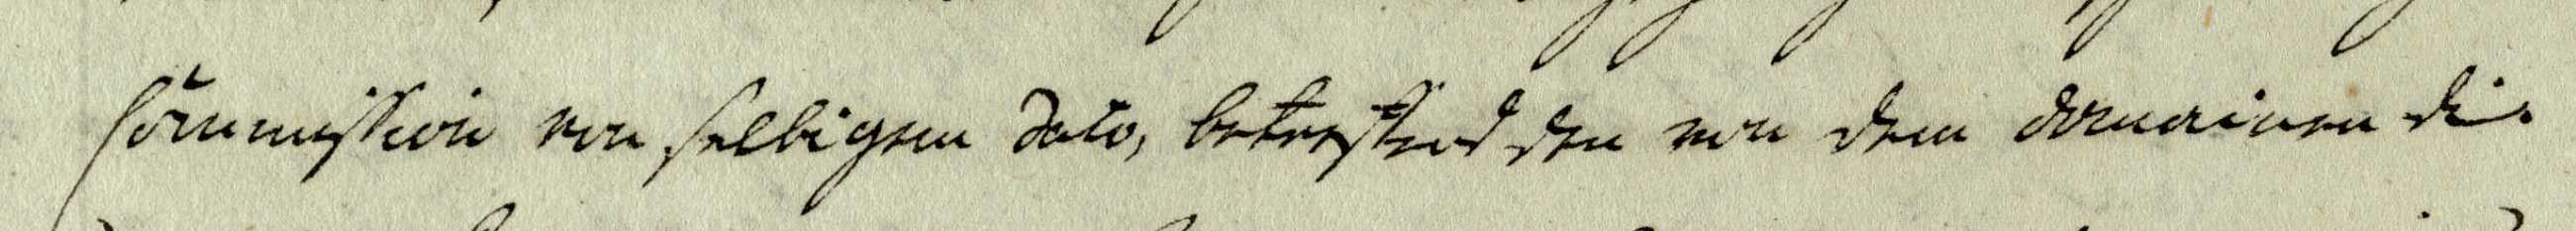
Commission von selbigem dato, betreffend den von dem Domainendi¬
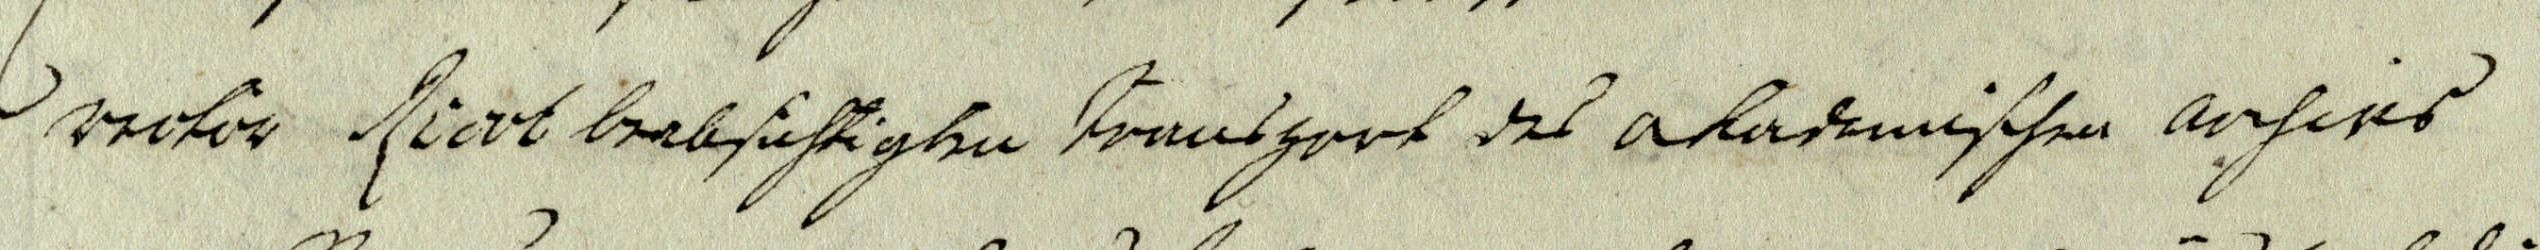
rector Ricot beabsichtigten Transport des akademischen Archivs
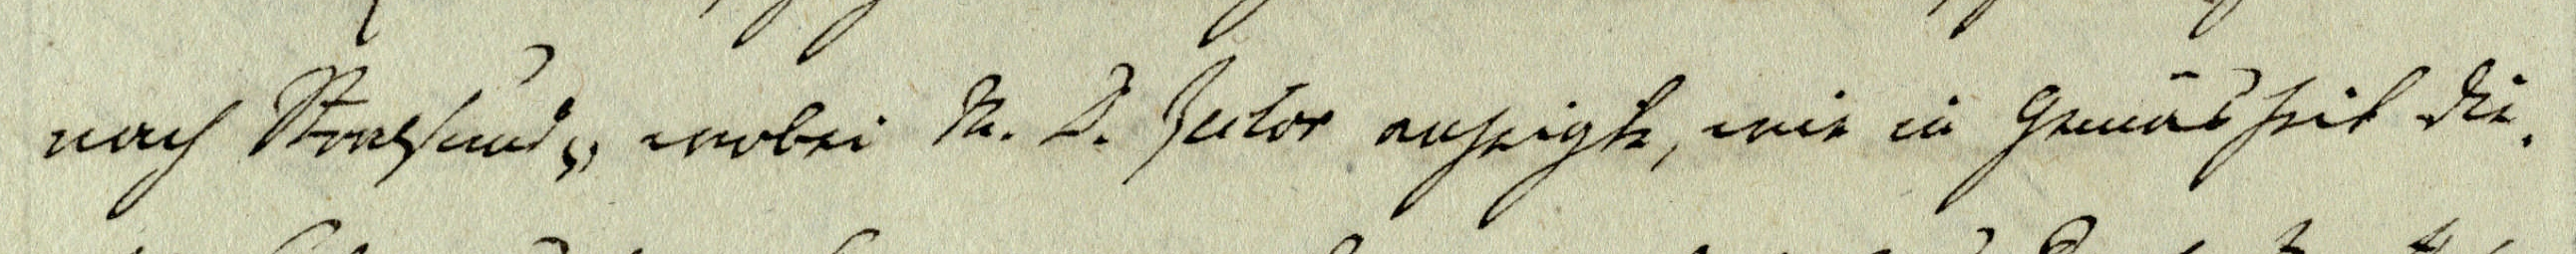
nach Stralsund,, wobei M. D. Rector anzeigte, wie in Gemäsheit die¬
